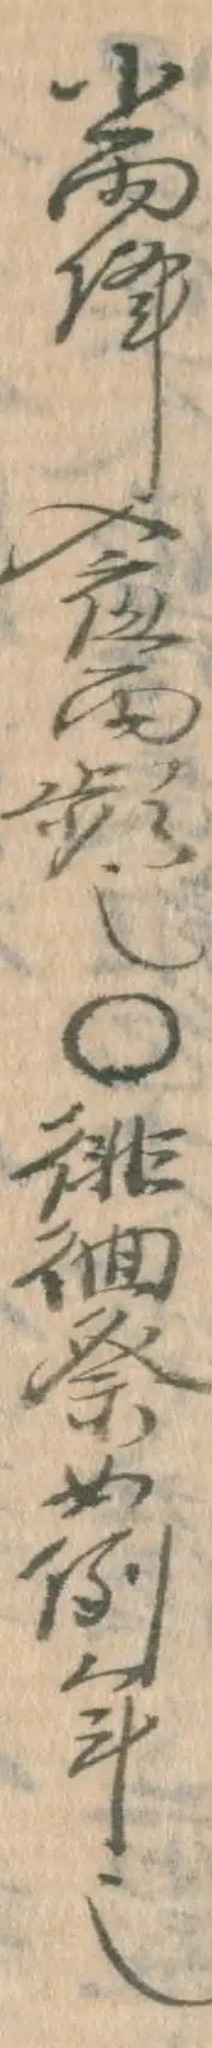小雨降入夜雨頻也○徘徊祭如例年也
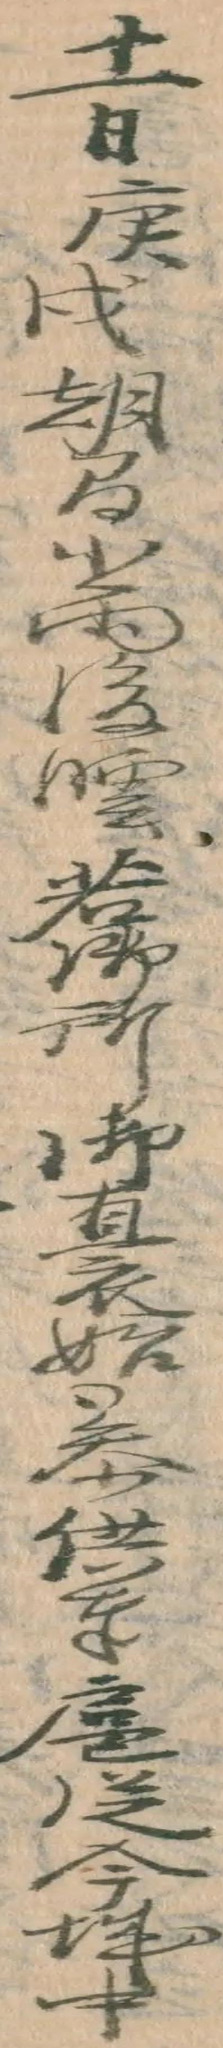十一日庚戌朝間小雨後曇若御所御直衣始御参供奉扈従今城中
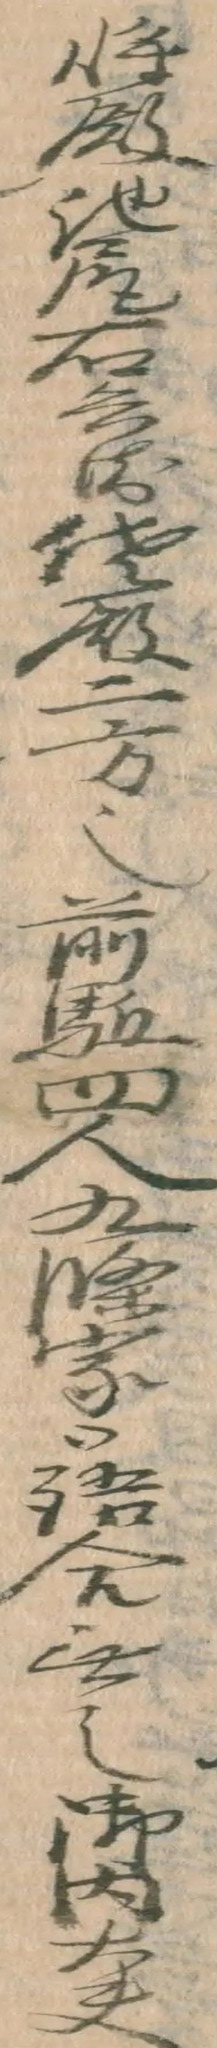将殿池尻右兵衛佐殿二方也前駈四人九條家御詰合無之御内大夫
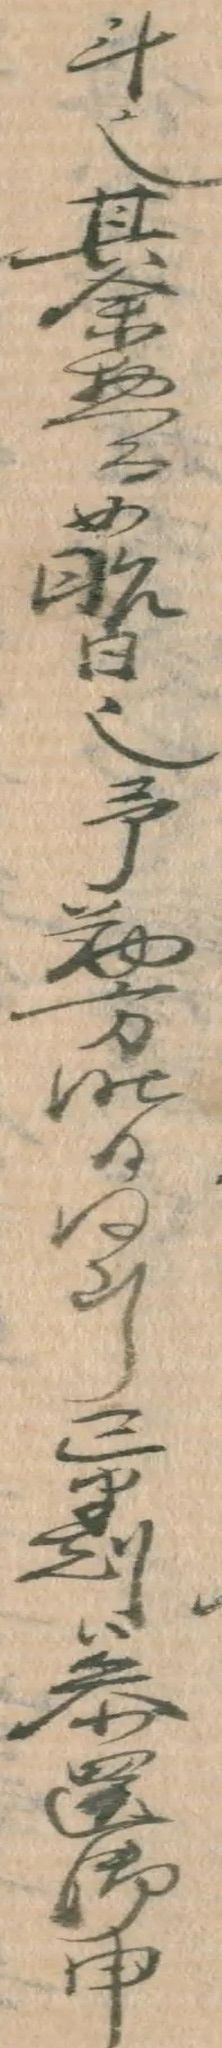斗也其余惣而如昨日也予勤方昨日ほろし巳半刻御参還御申
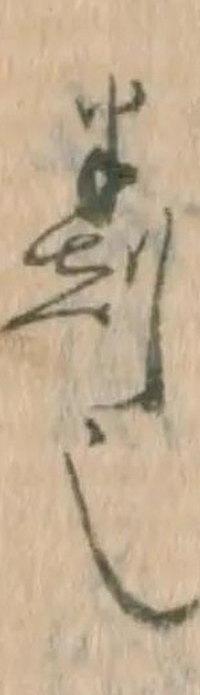半刻也
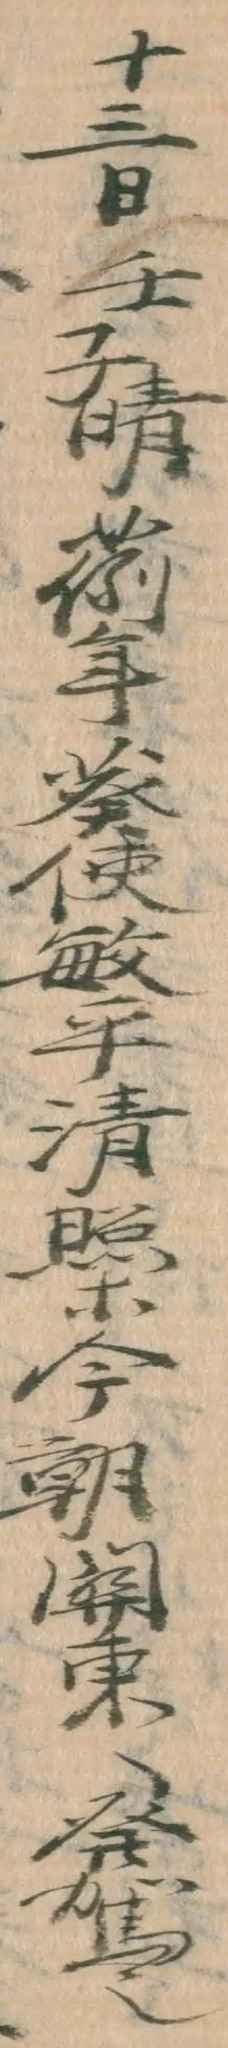十三日壬子晴如例年葵使敏平清照等今朝関東へ発駕也
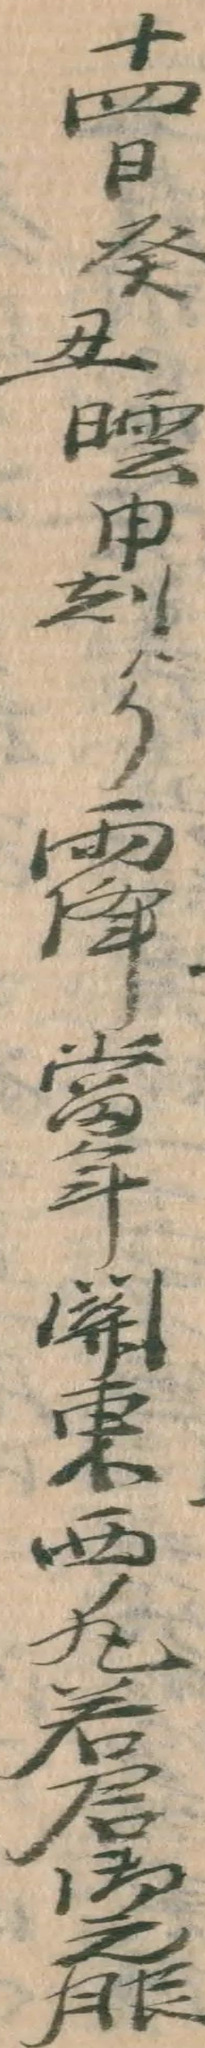十四日癸丑曇申刻より雨降當年関東西ノ丸若君御元服
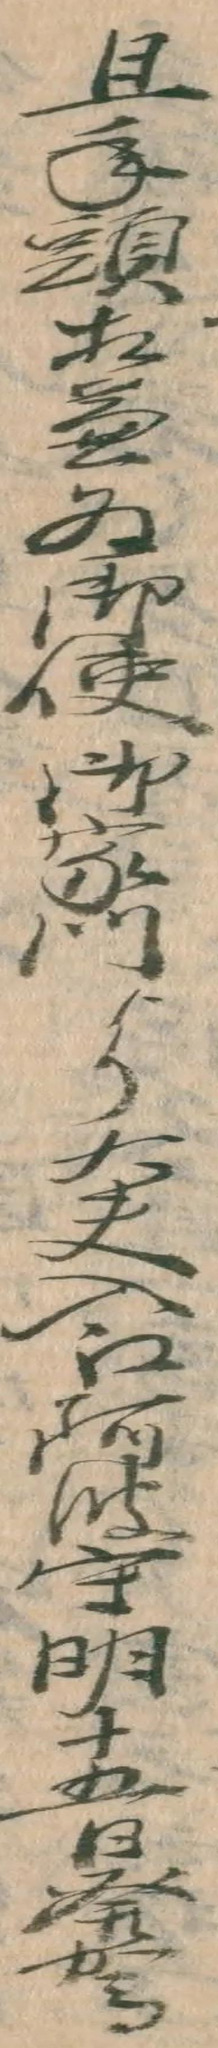且年頭相兼為御使御家門より大夫入江阿波守明十五日御発駕
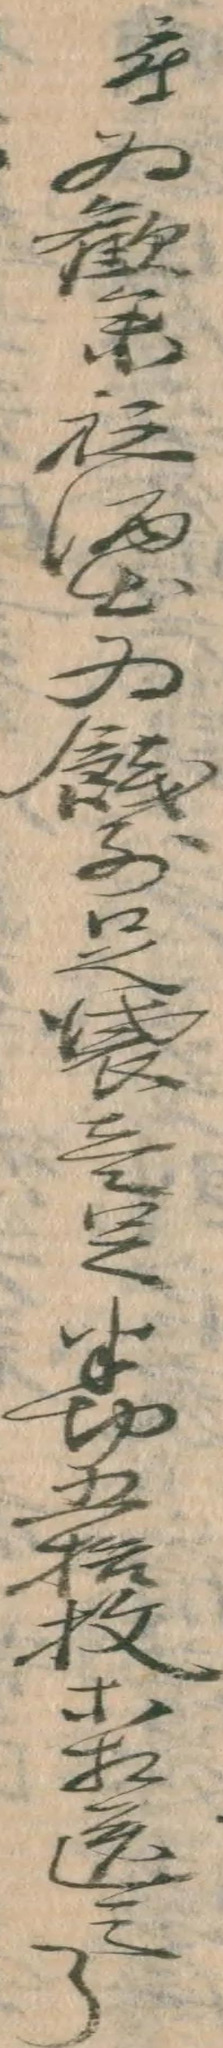ニ付為歓楽祝酒出為餞別足袋壱足半切五拾枚等相送之了
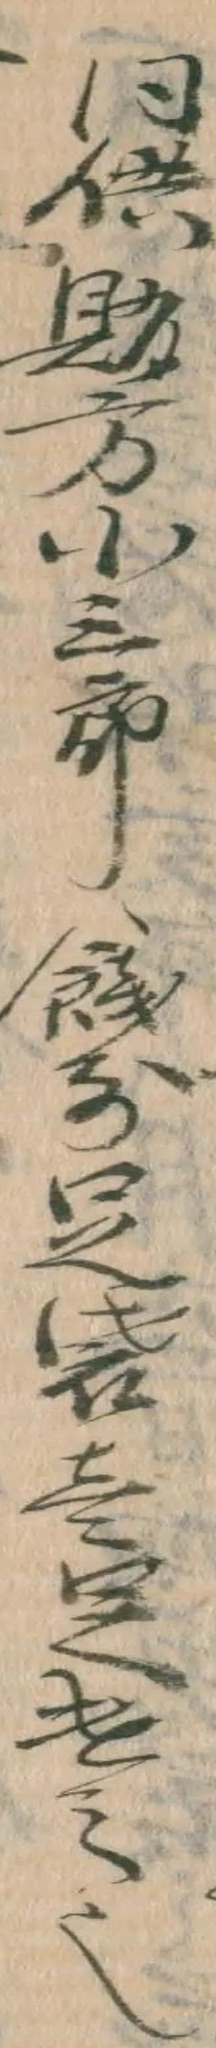同供賄方小三郎餞別足袋壱足遣之也
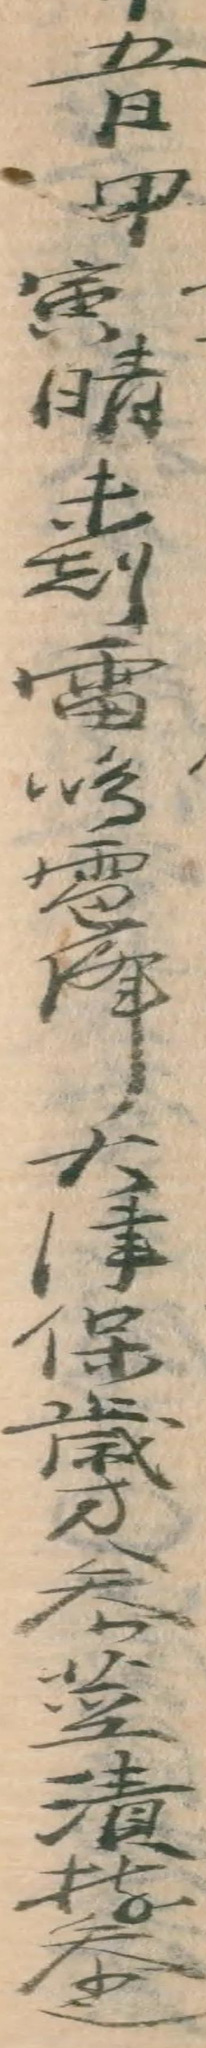十五日甲寅晴未刻雷鳴雹降大津保歳方へ参茎漬持参也
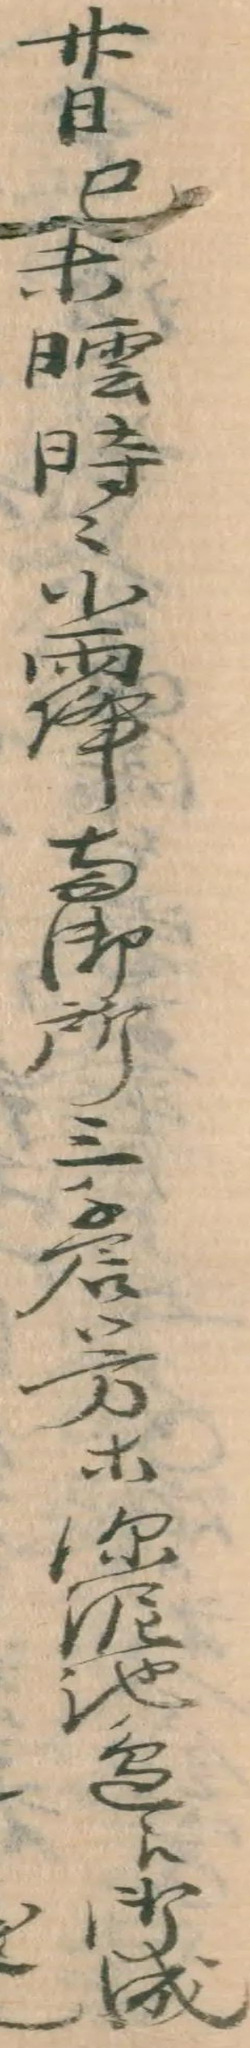廿日己未曇時々小雨降両御所三子容御方等深泥池邊江御成
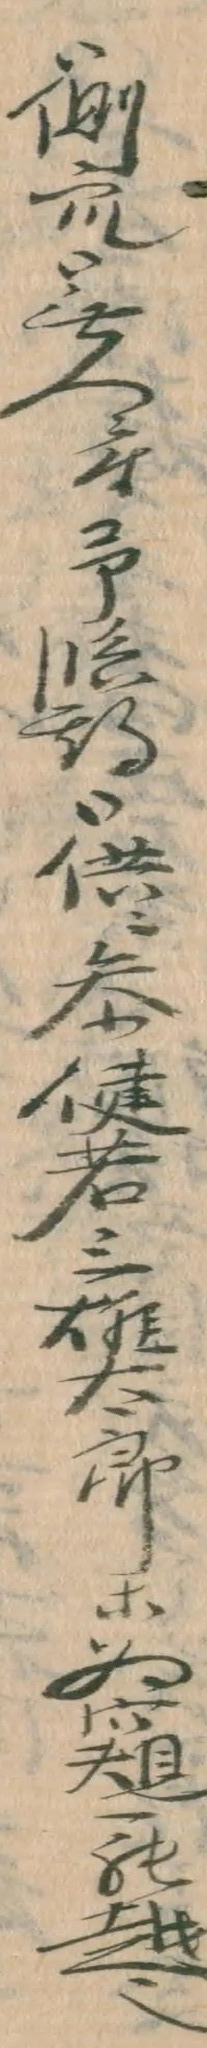御側衆御無人ニ付予臨期御供ニ参健若三雄太郎等為窺罷越也
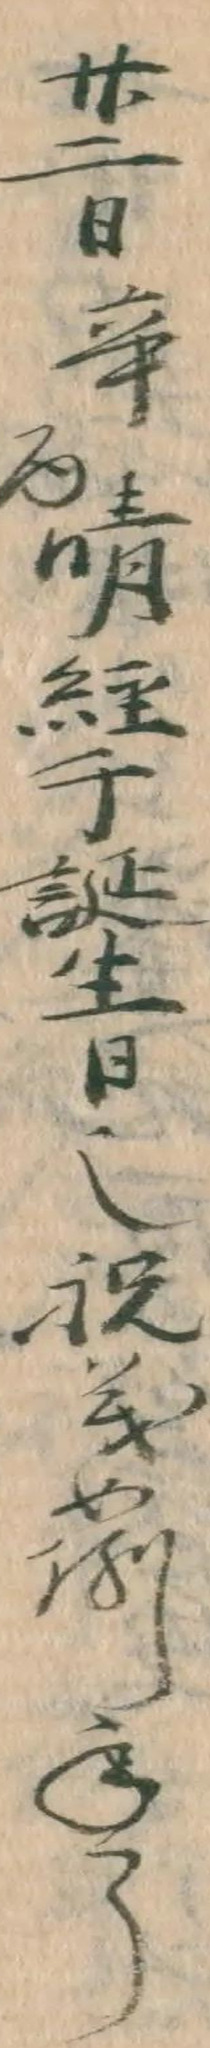廿二日辛酉晴経千誕生日也祝義如例年了
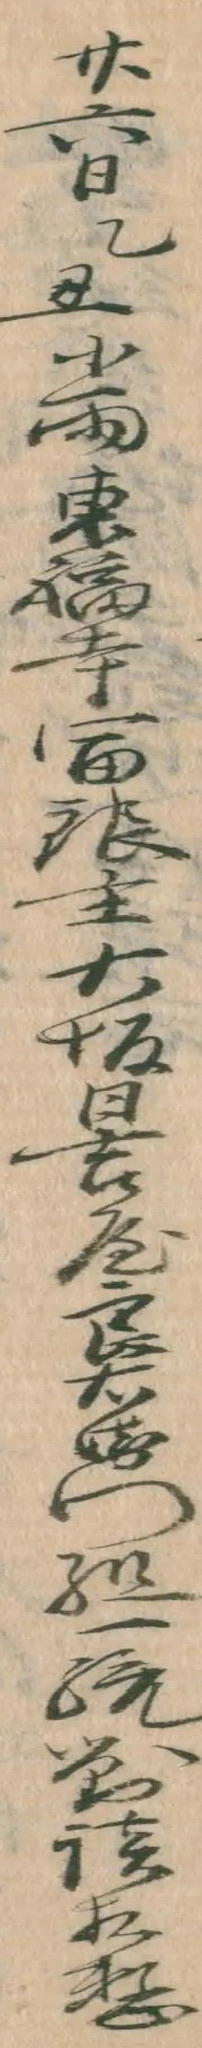廿六日乙丑小雨東福寺冨銀主大坂日吉屋良右衛門組一統対談相整
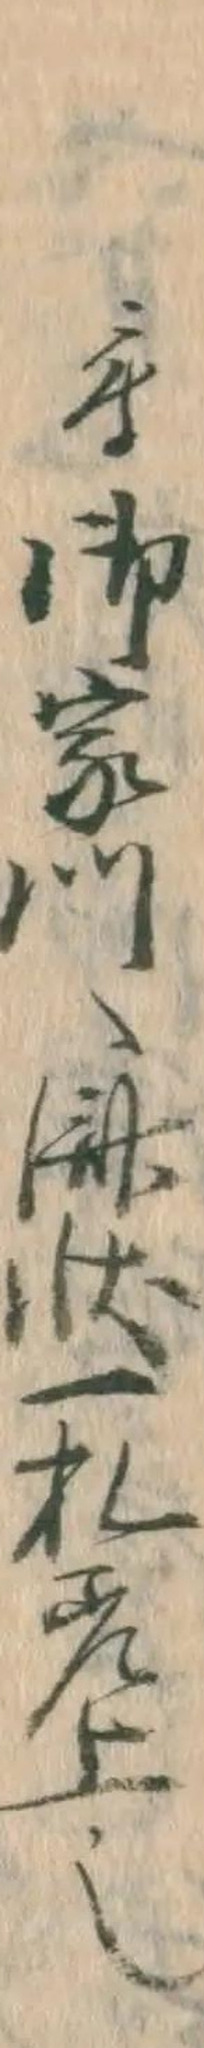ニ付御家門へ済状一札差上也
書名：賀茂社記録. 第65冊
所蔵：国立国会図書館 National Diet Library, JAPAN
